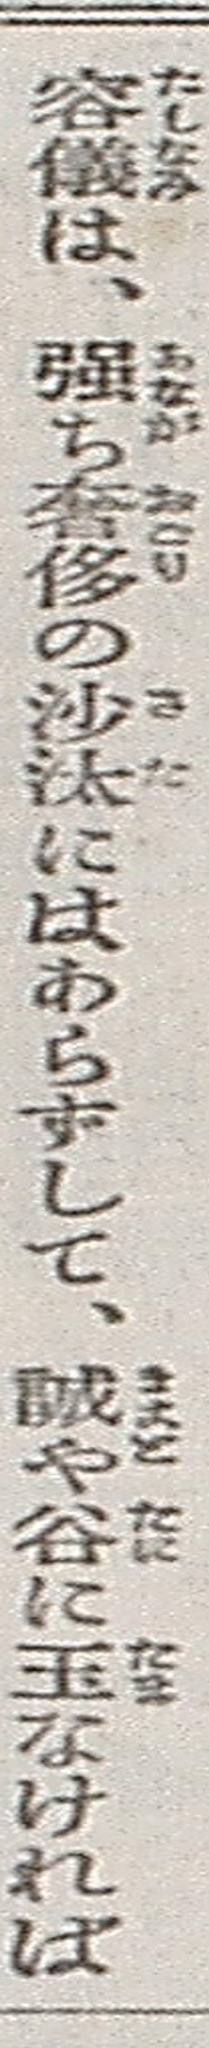容儀は、強ち奢侈の沙汰にはあらずして、誠や谷に玉なければ
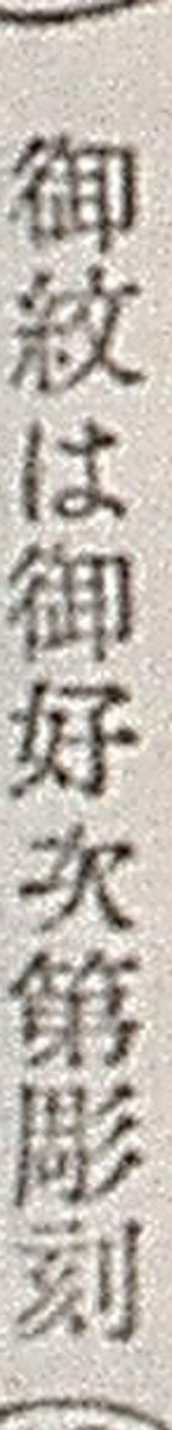御紋は御好次第彫刻
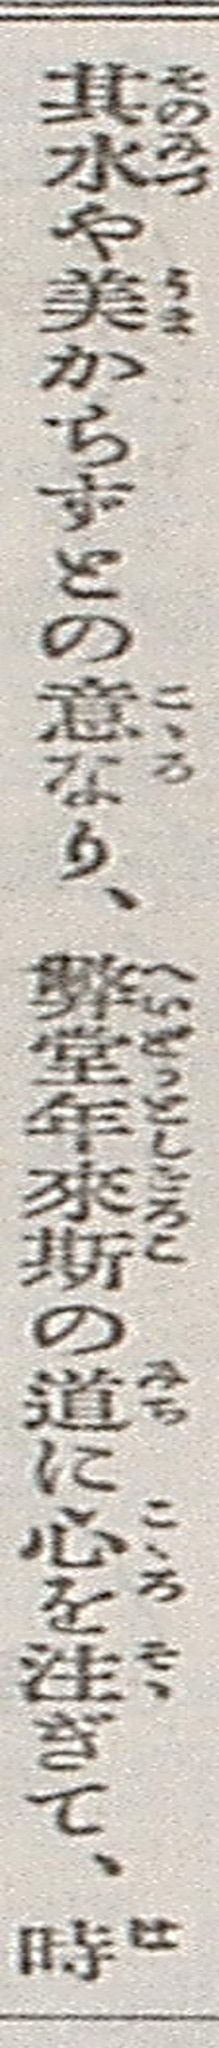其水や美からずとの意なり、弊堂年来期の道に心を注ぎて、時
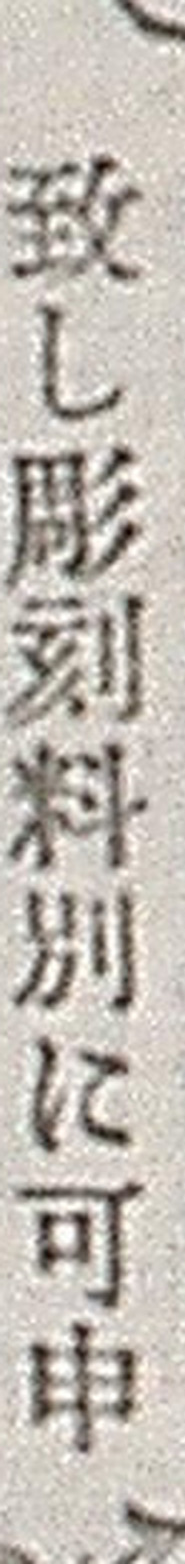致し彫刻料別に可申
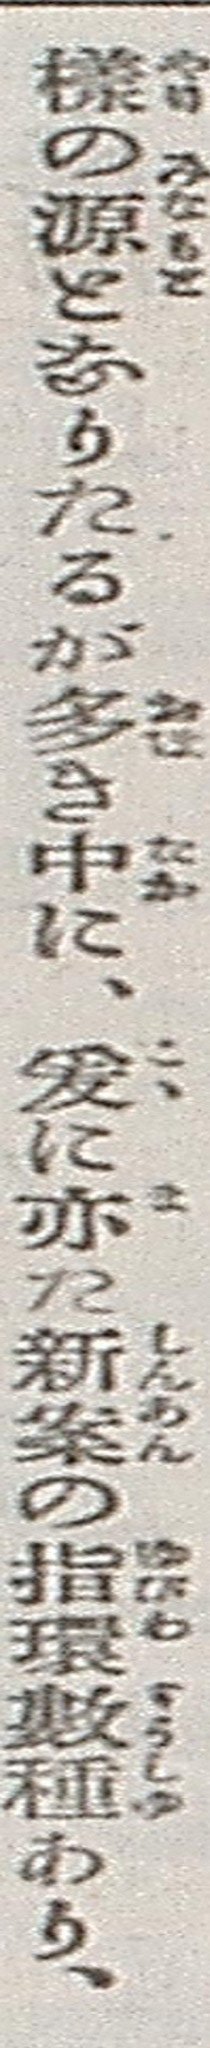様の源となりたるが多き中に、爰に亦た新案の指環数種あり、
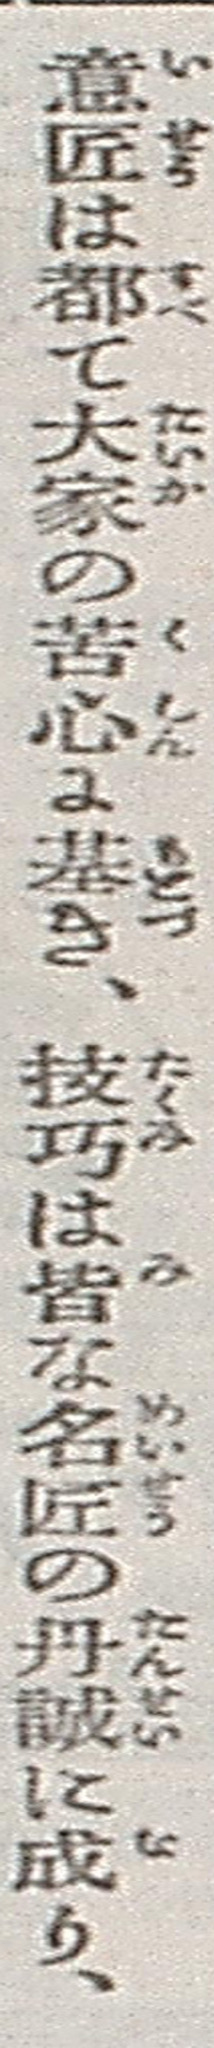意匠は都て大家の苦心に基き、技巧は皆な名匠の丹誠に成り、
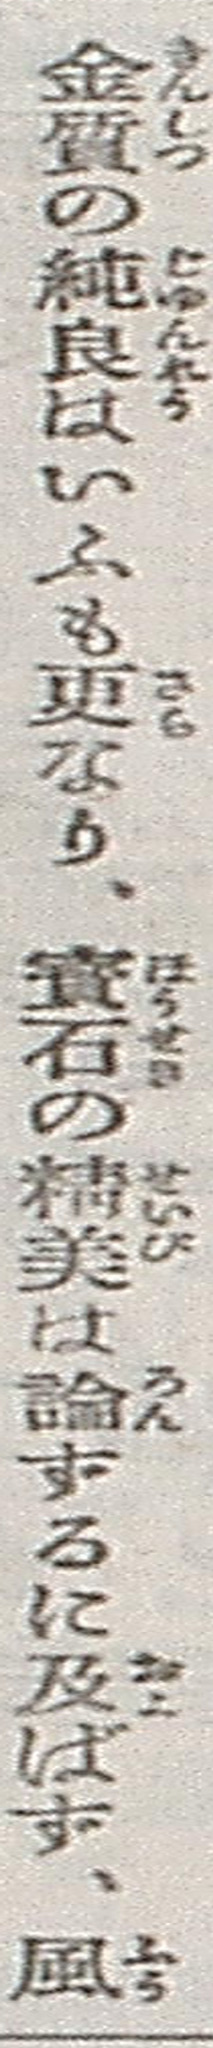金質の純良はいふも更なり、宝石の精美は論ずるに及ばず、風
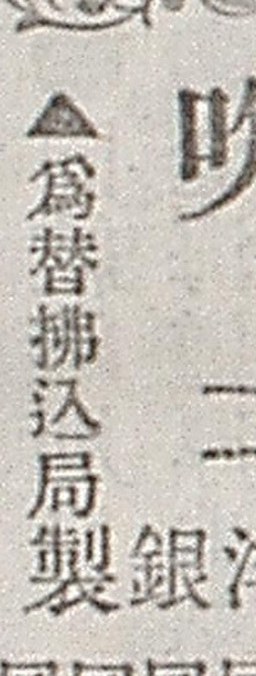▲為替払込局
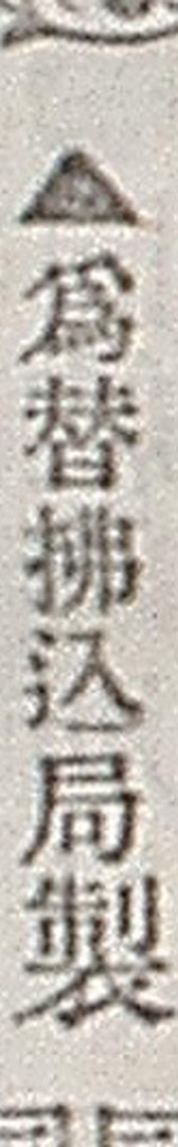▲為替払込局
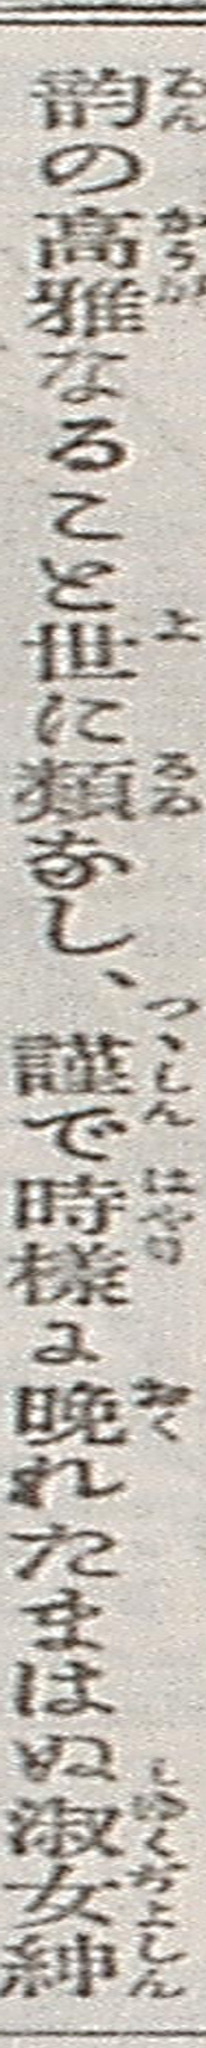韵の高雅なること世に類なし、謹で時様に晩れたまはぬ淑女紳
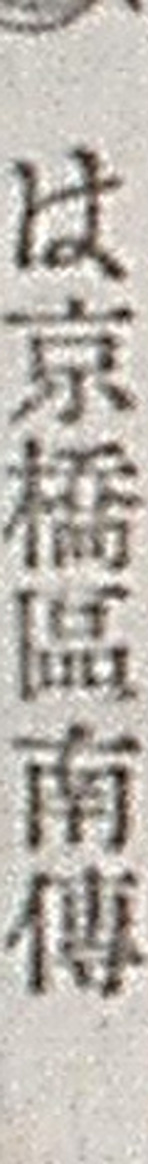は京橋区南伝
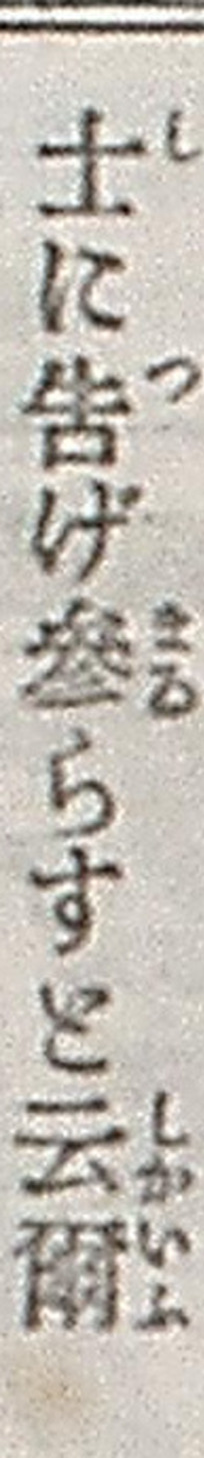士に告げ参らすと云爾
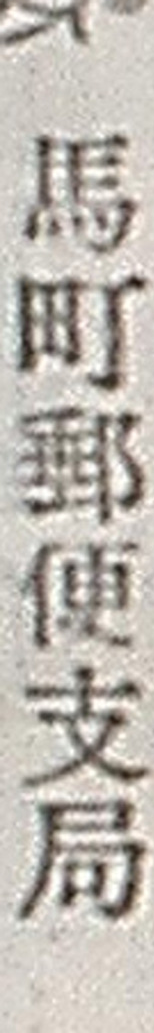馬町郵便支局
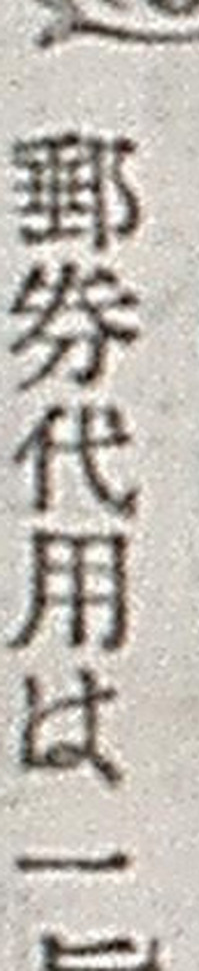郵券代用は一
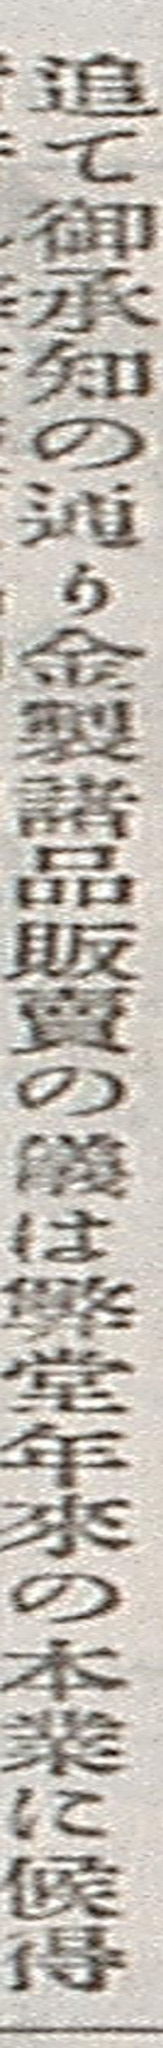追て御承知の通り金製諸品販売の儀は弊堂年来の本業に候得
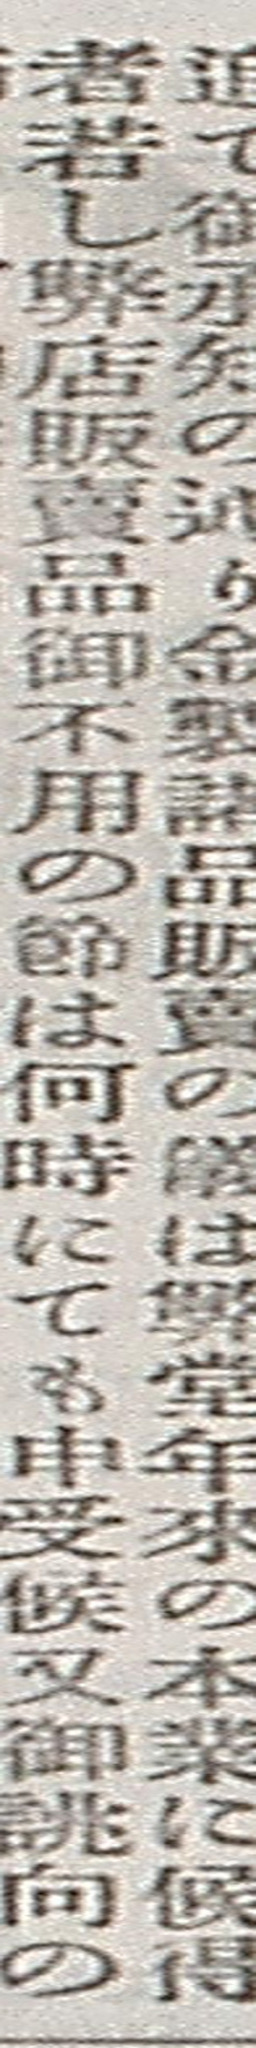者若し弊店販売品御不用の節は何時にても申受候又御誂向の
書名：風俗畫報臨時増刊第百二十號　大海嘯被害録（下）
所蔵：東京大学地震研究所図書室 Earthquake Research Institute Library, The University of Tokyo, JAPAN
